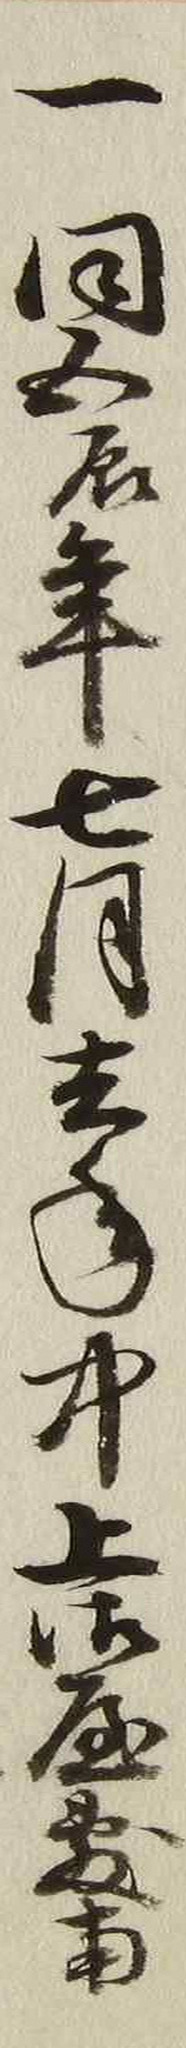一同五辰年七月去年中上御屋敷南
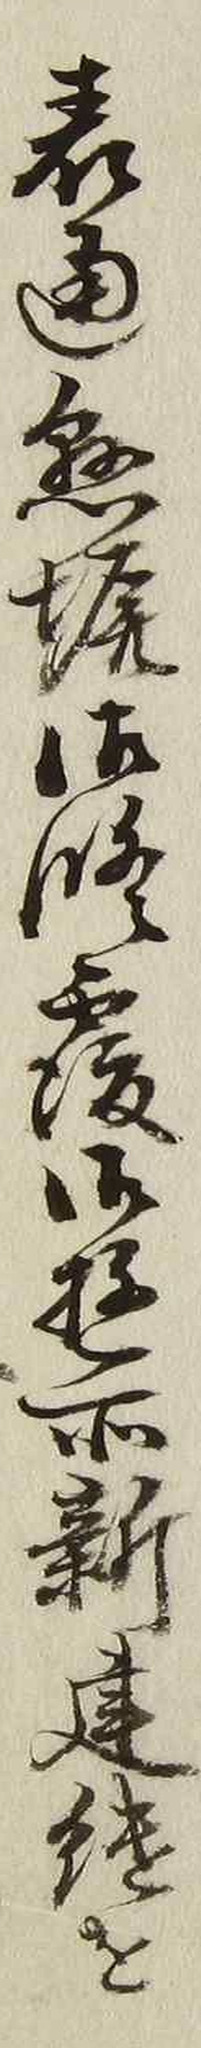表通懸塀御修覆御遊所新建継を
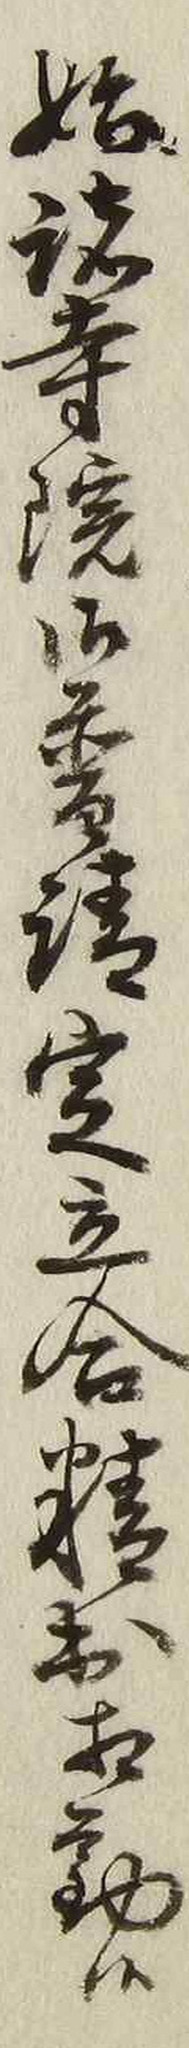始諸寺院御普請定立合精出相勤候
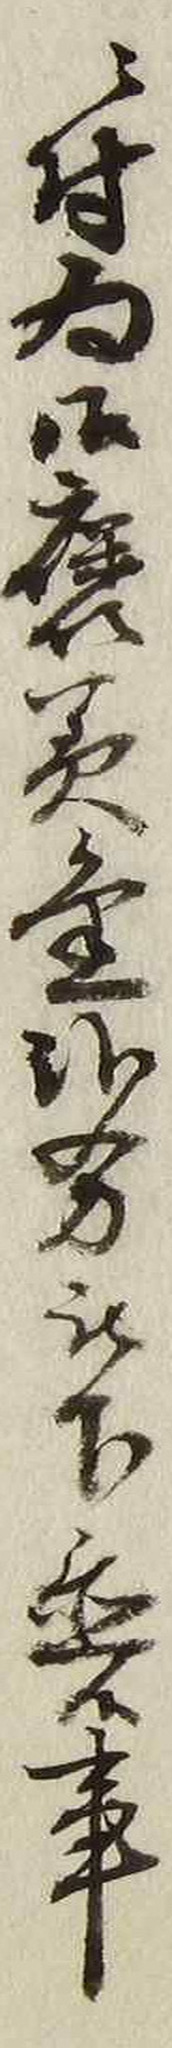ニ付為御褒美金弐分被下置候事
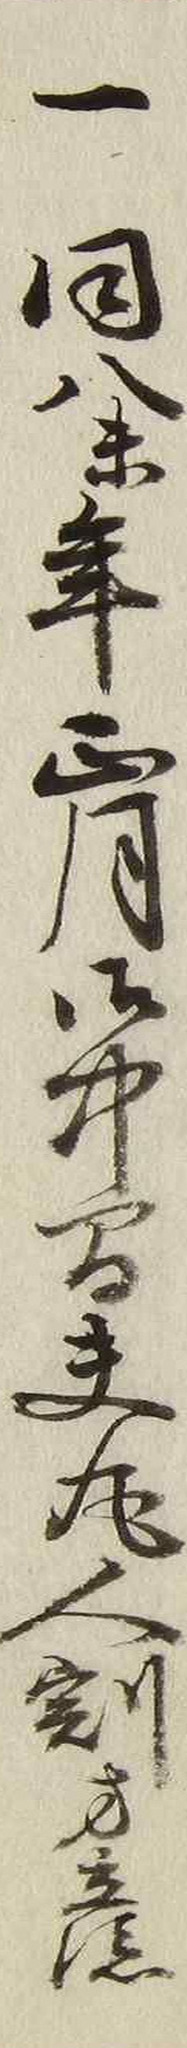一同八未年正月御中間夫丸人割方身立添
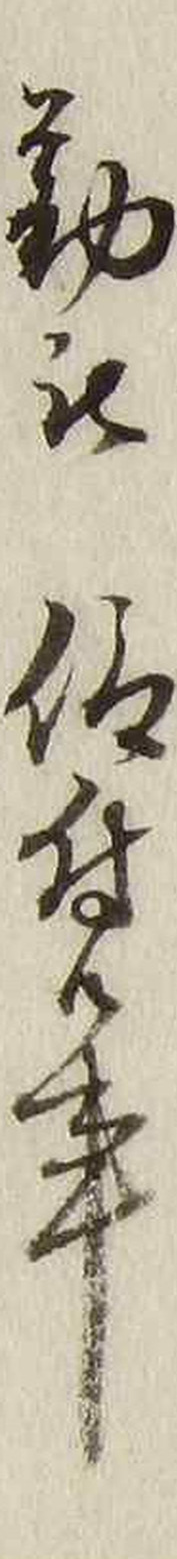勤被仰付候事
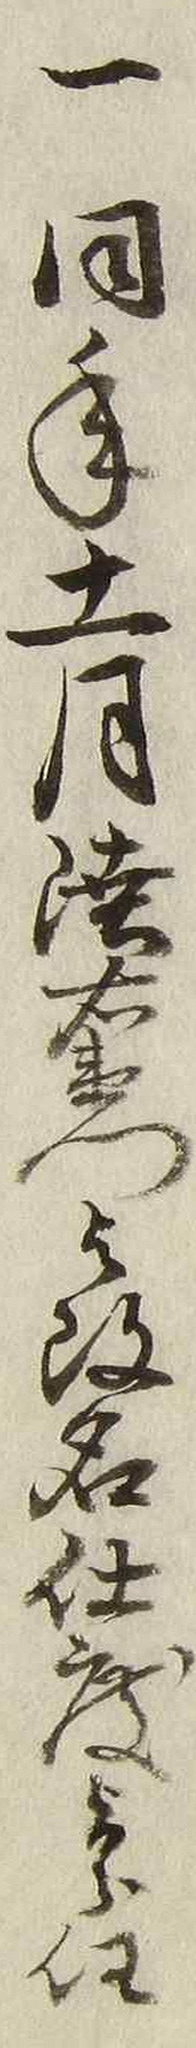一同年十一月陸右衛門与改名仕度旨被任
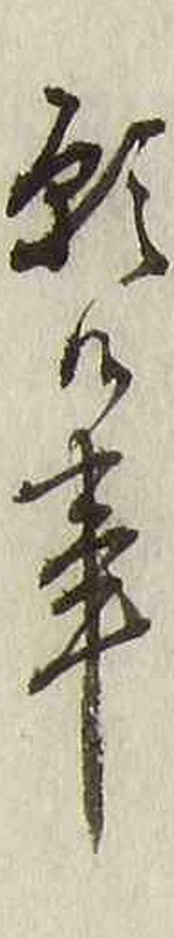願候事

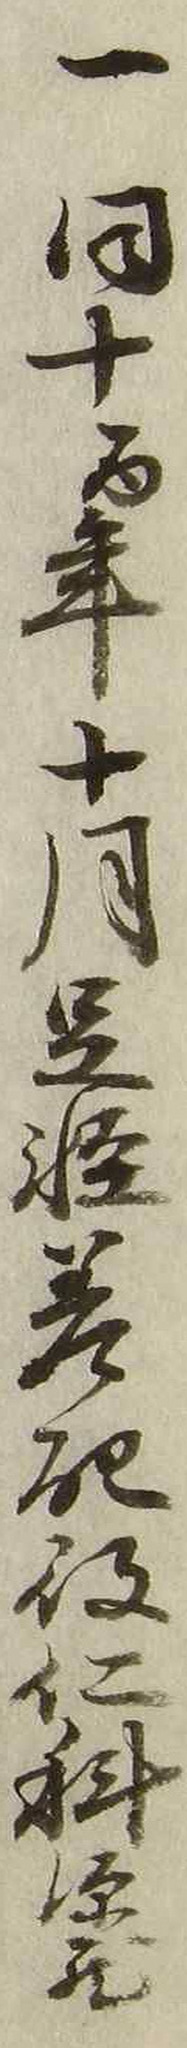一同十酉年十月足軽差配役仁科源蔵
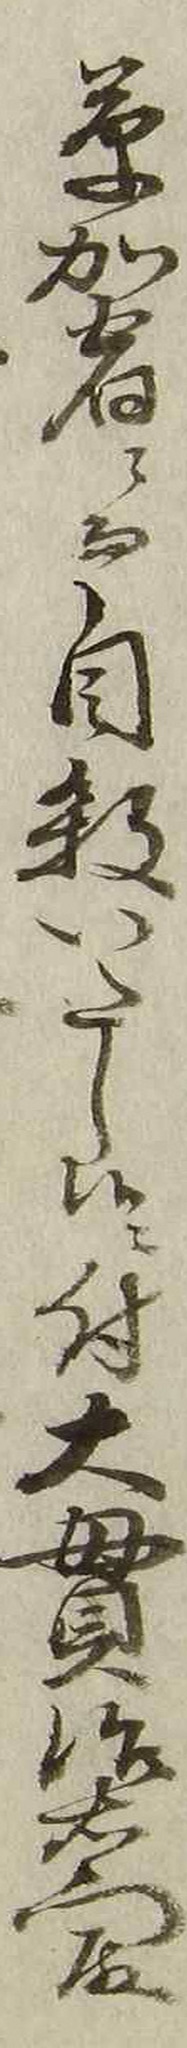草加宿ニ而自殺いたし候ニ付大貫治右衛門殿
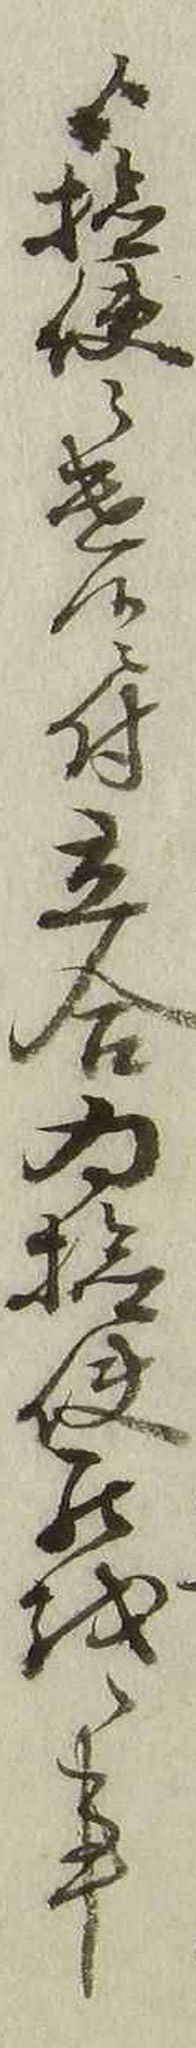ゟ検使ニ遣候ニ付立合為検使罷越候事
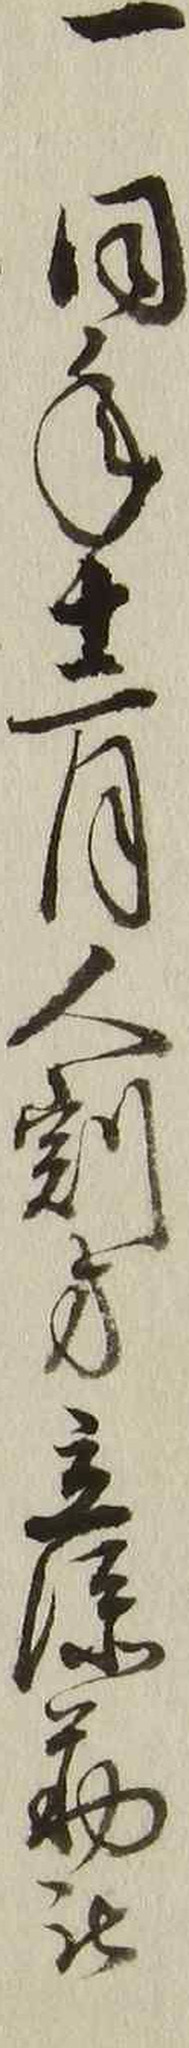一同年十二月人割方立添勤被
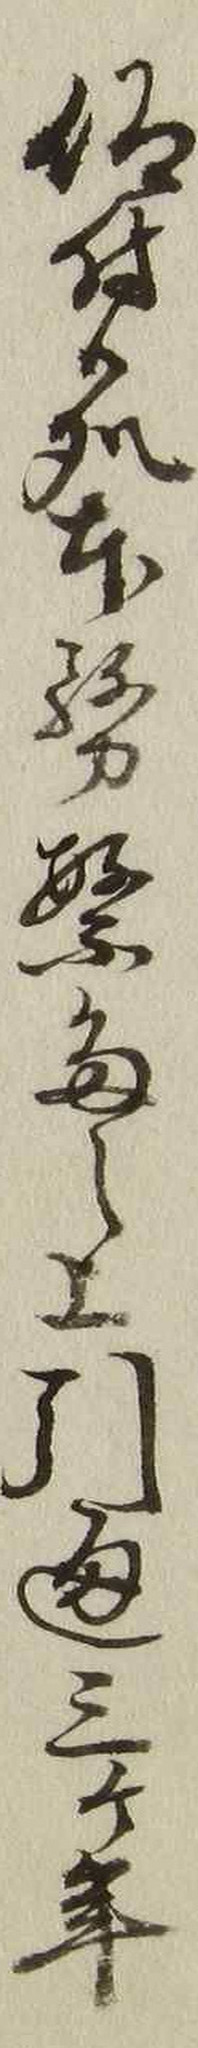仰付候処本務繁多之上引通三ヶ年
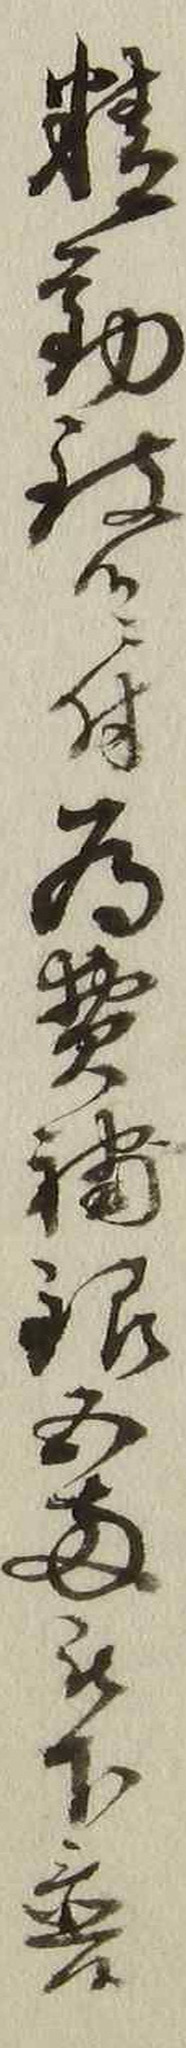精勤致候ニ付為費補銀五両被下置候
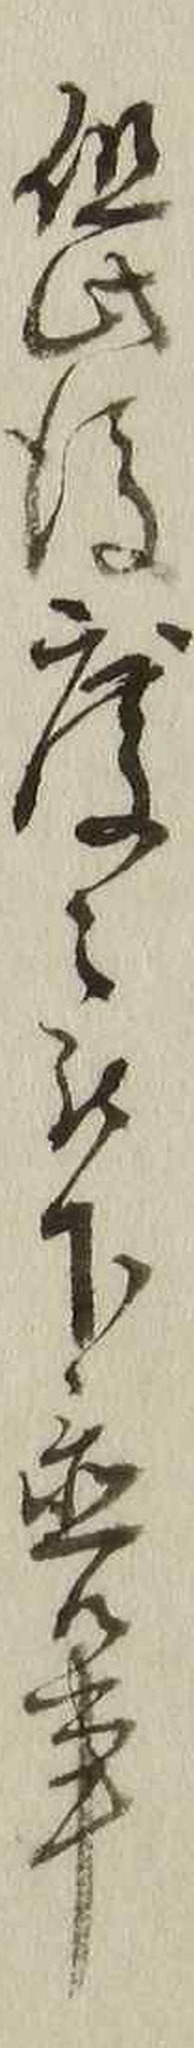但此後度々被下置候事
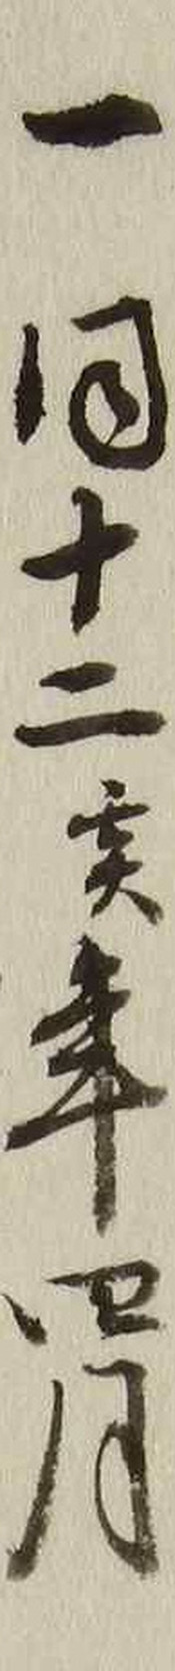一同十二亥年四月
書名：諸士系譜　巻之39　は之部7
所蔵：会津若松市立会津図書館
